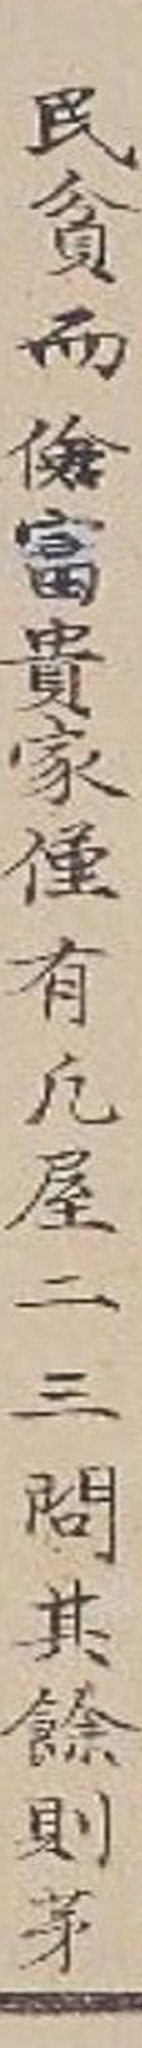民貧而倹富貴家僅有凡屋二三問其余則茅
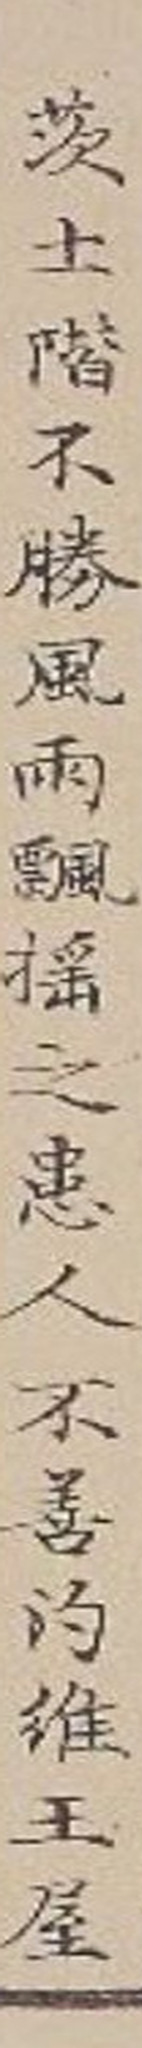茨土階不勝風雨飄揺之患人不善的維王屋
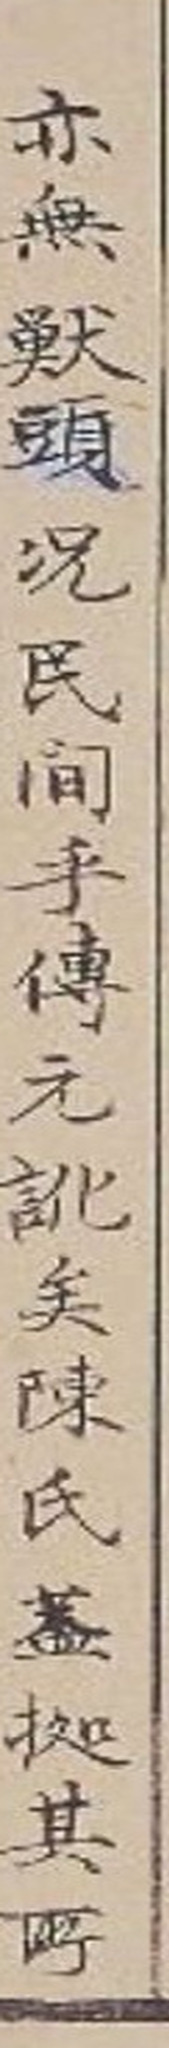亦無獣頭況民間乎伝元訛矣陳氏蓋拠其所
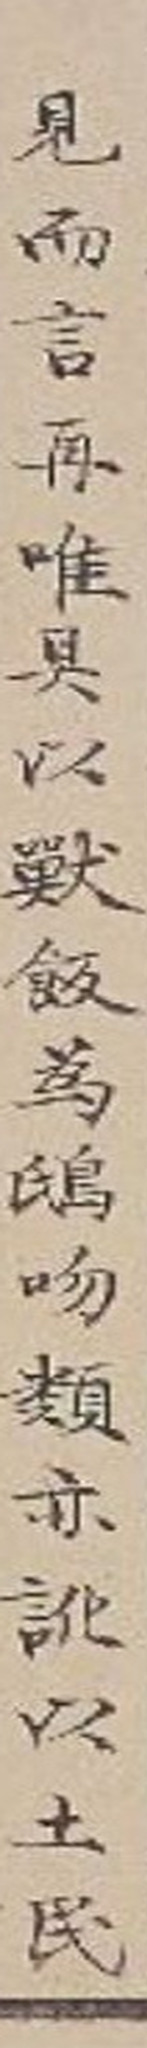見而言再唯具以獣飯為鴟吻類亦訛此土民
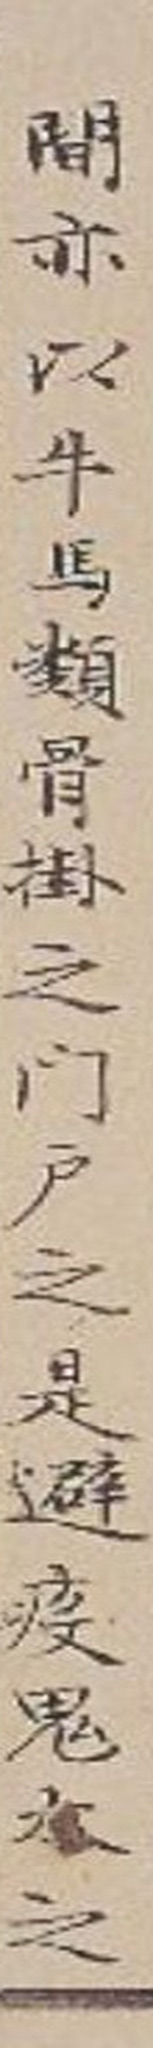間亦以牛馬類骨掛之門戸之是避疫鬼之
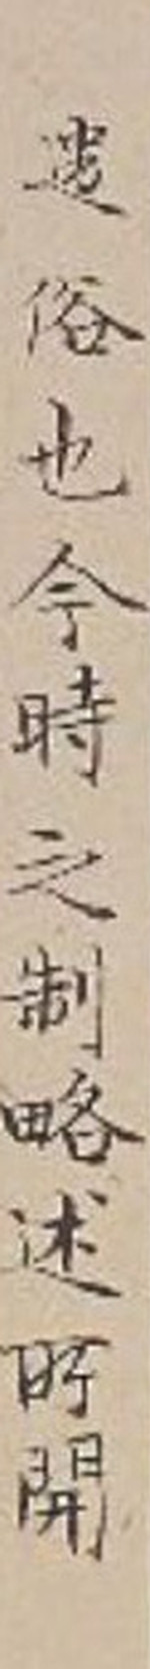遺俗也今時之制略述所開
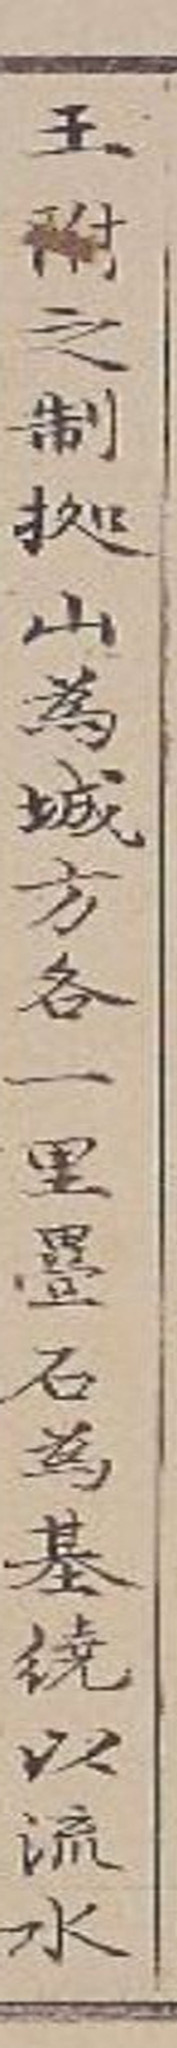王附之制拠山為城方各一里畳石為基繞以流水
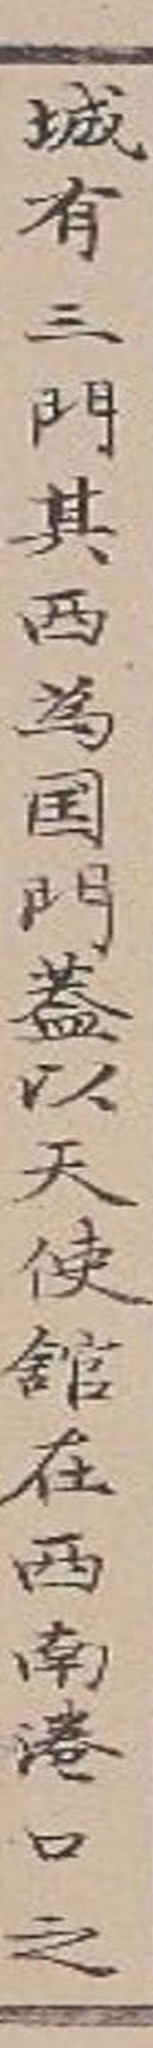城有三門其西為国門蓋以天使館在西南港口之
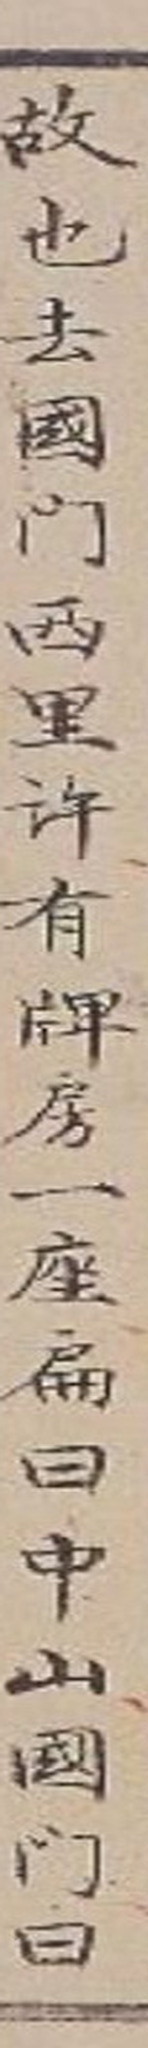故也去国門四里許有牌房一座扁曰中山国門曰

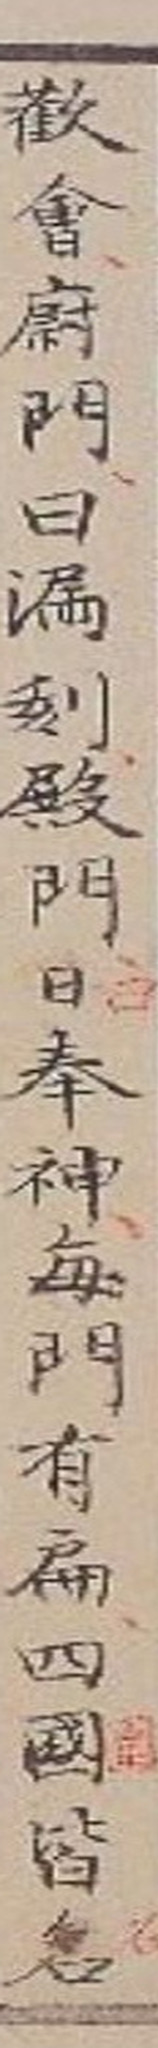歓会、門、曰漏刻、殿門日曰奉神、毎門有扁、四国周皆石
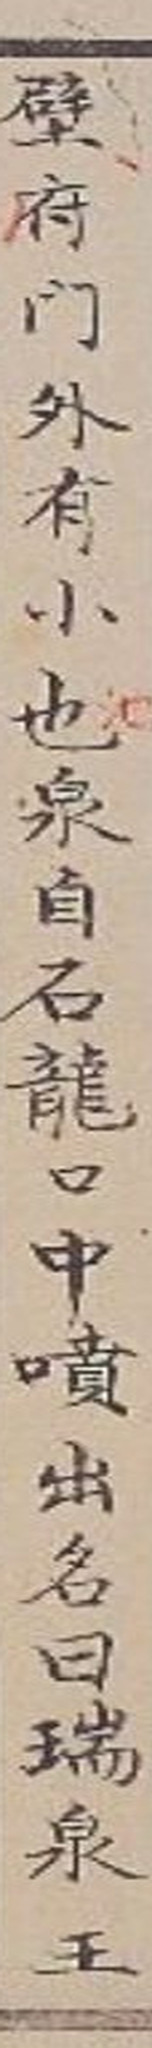壁、府門外有小也池泉自石竜口中噴出名曰瑞泉王
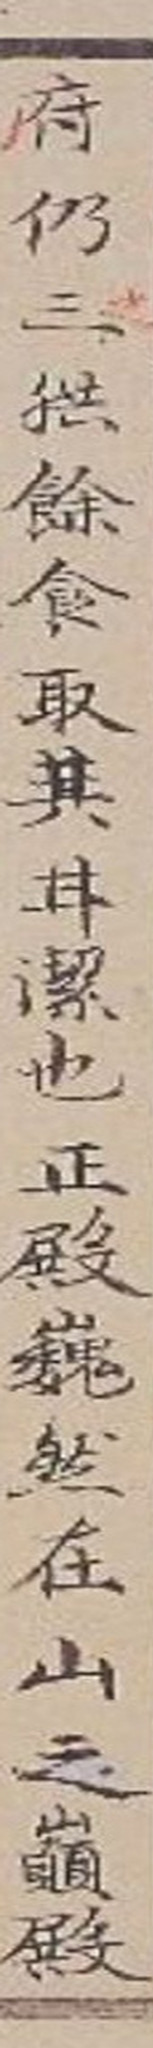府仍三之余食取其潔也正殿巍然在山之巓殿
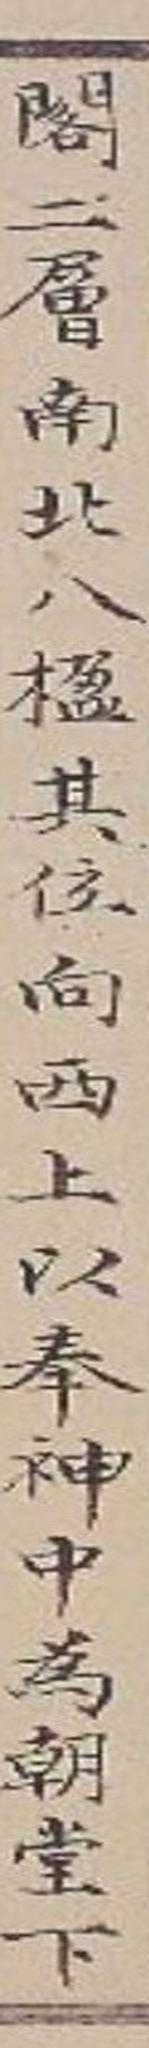閣二層南北八楹其位向西上以奉神中為朝堂下
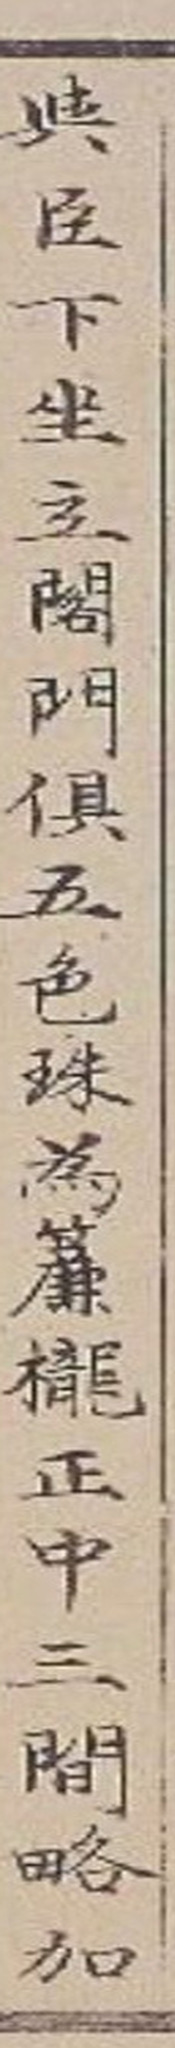与臣下坐立閣門俱五色珠為簾櫳正中三間略加
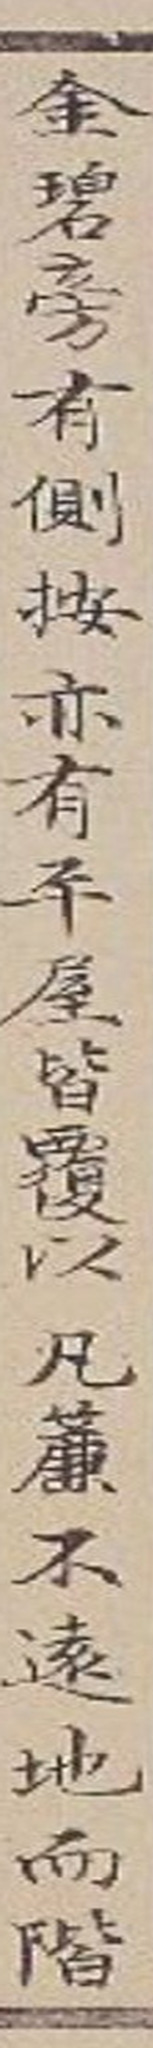金碧旁有側按亦有平屋皆覆以凡簾不遠地而階
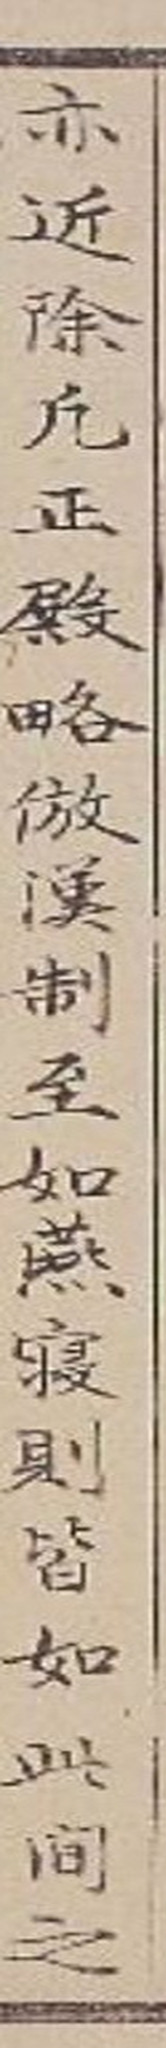亦近除凡正殿略倣漢制至如燕寝則皆如此間之
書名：南島志 全
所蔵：University of the Ryukyus Library
